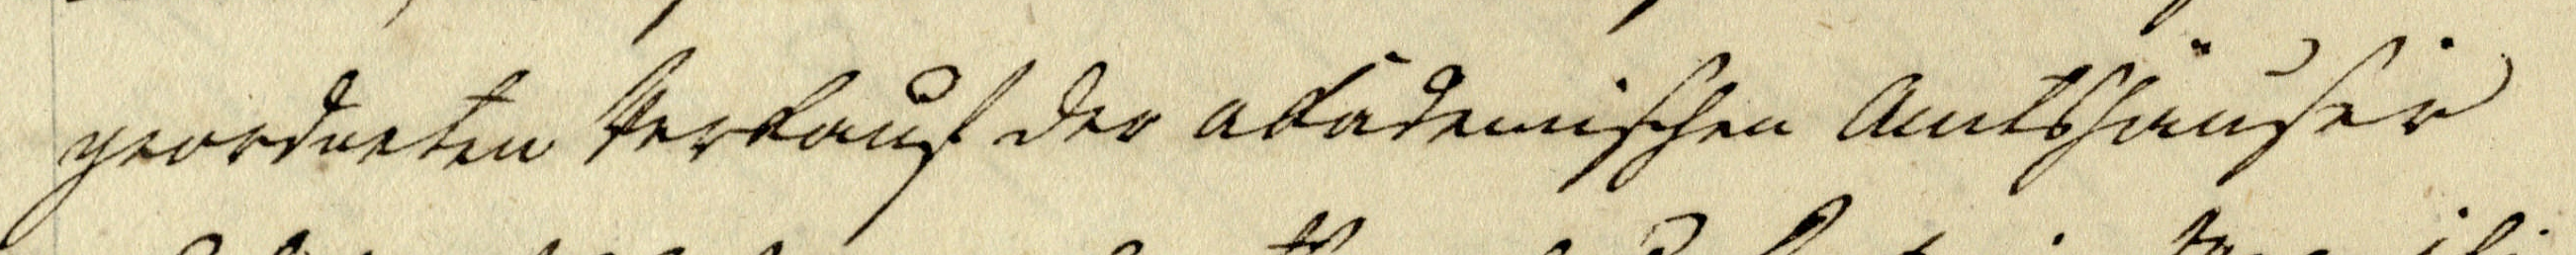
geordneten Verkauf der akademischen Amtshäuser
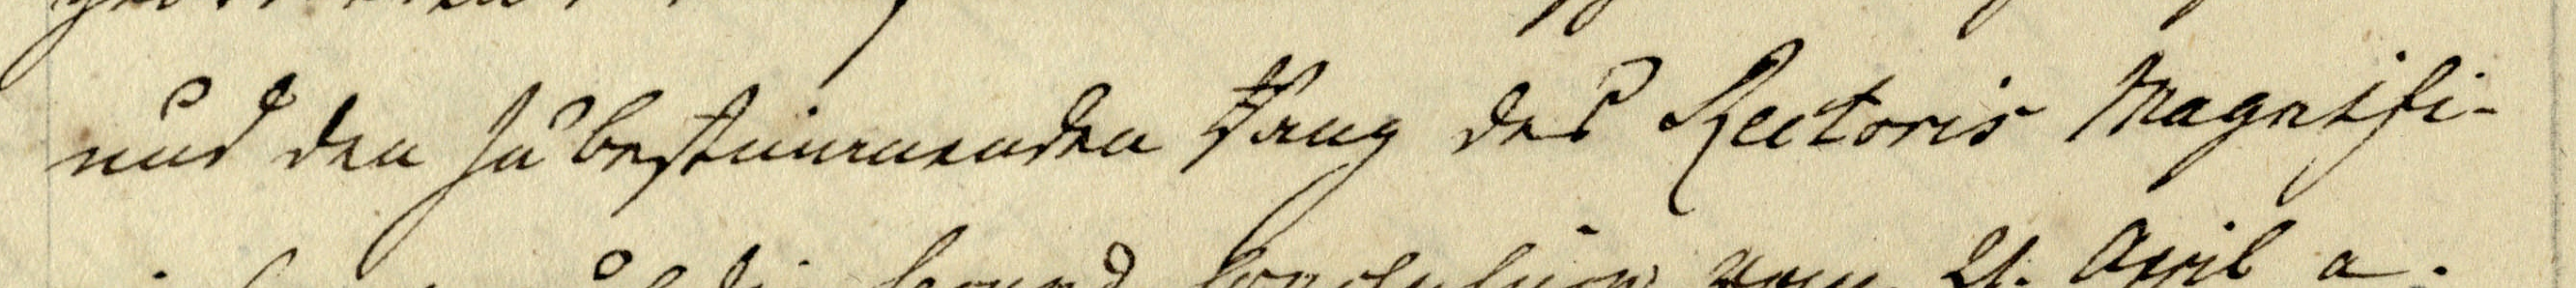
und den zu bestimmenden Rang des Rectoris Magnifi¬
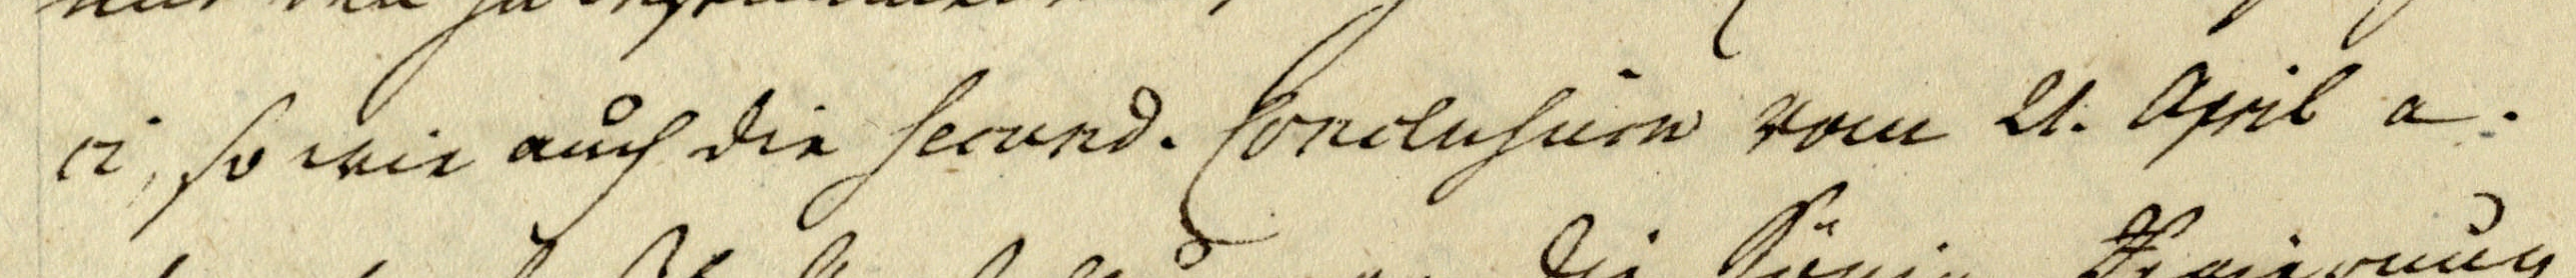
ci, so wie auch die secund. Conclusum vom 21. April a.
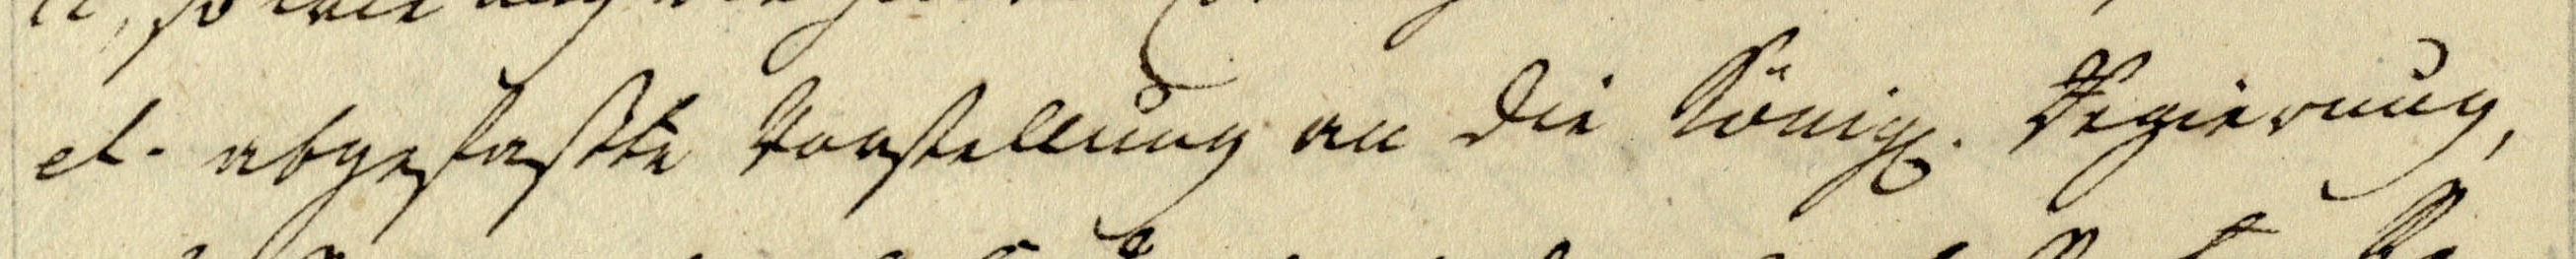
et. abgefaßte Vorstellung an die Königl. Regierung,
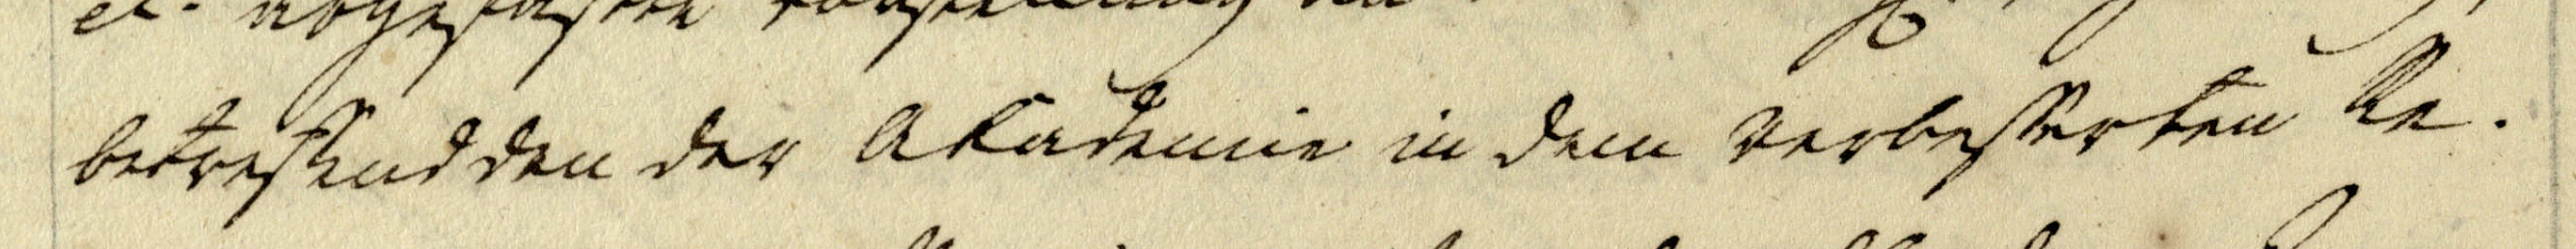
betreffend den der Akademie in dem verbesserten Re¬
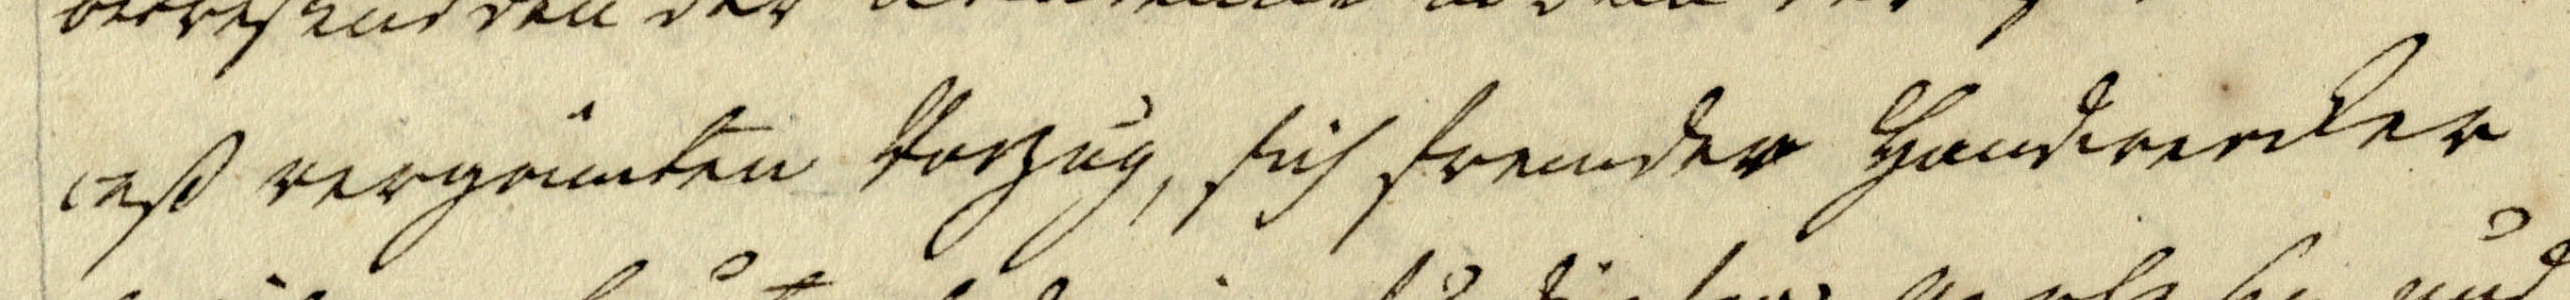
ceß vergönnten Vorzug, sich fremder Handwercker
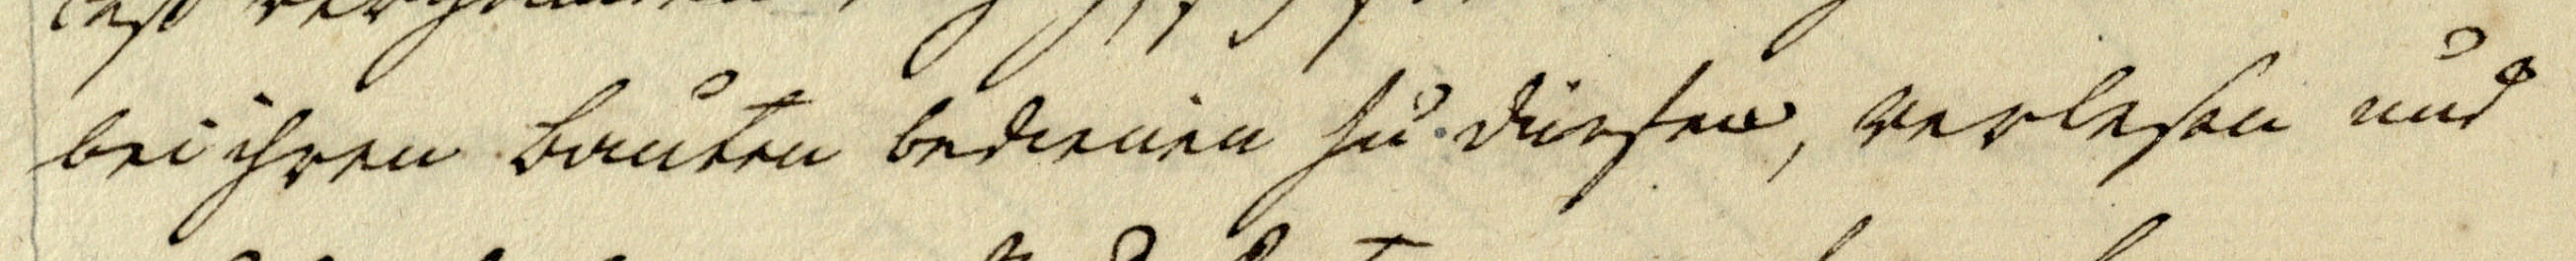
bei ihren Bauten bedienen zu dürfen, verlesen und
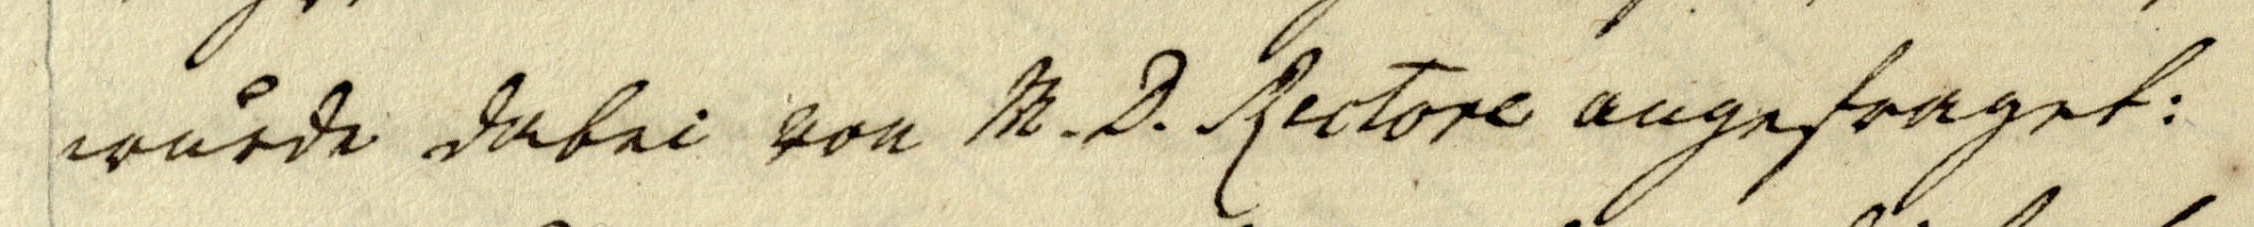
wurde dabei von M. D. Rectore angefraget:
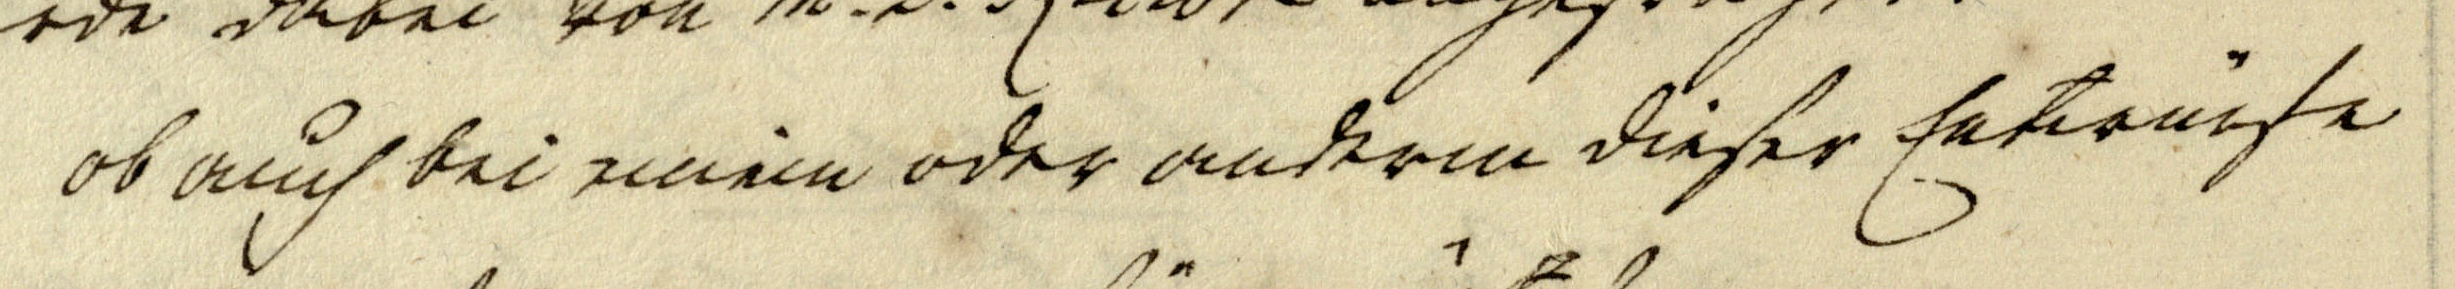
ob auch bei einem oder andern dieser Entwürfe
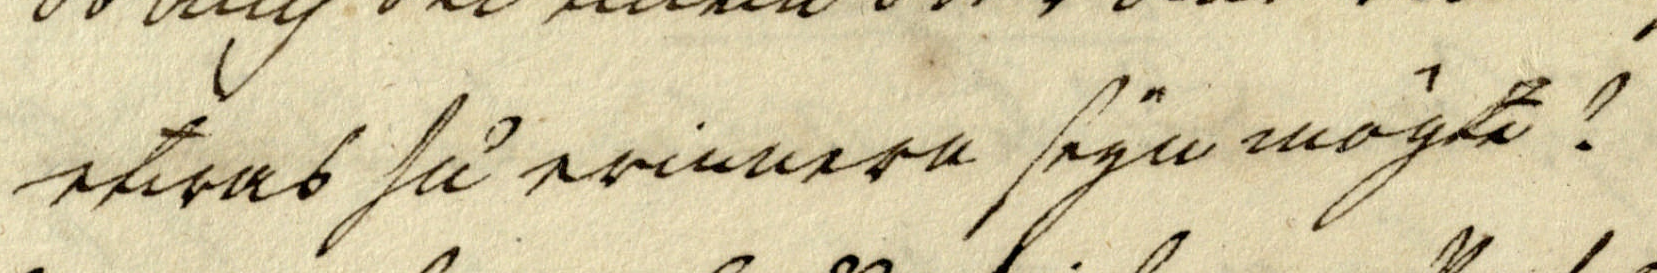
etwas zu erinnern seÿn mögte?
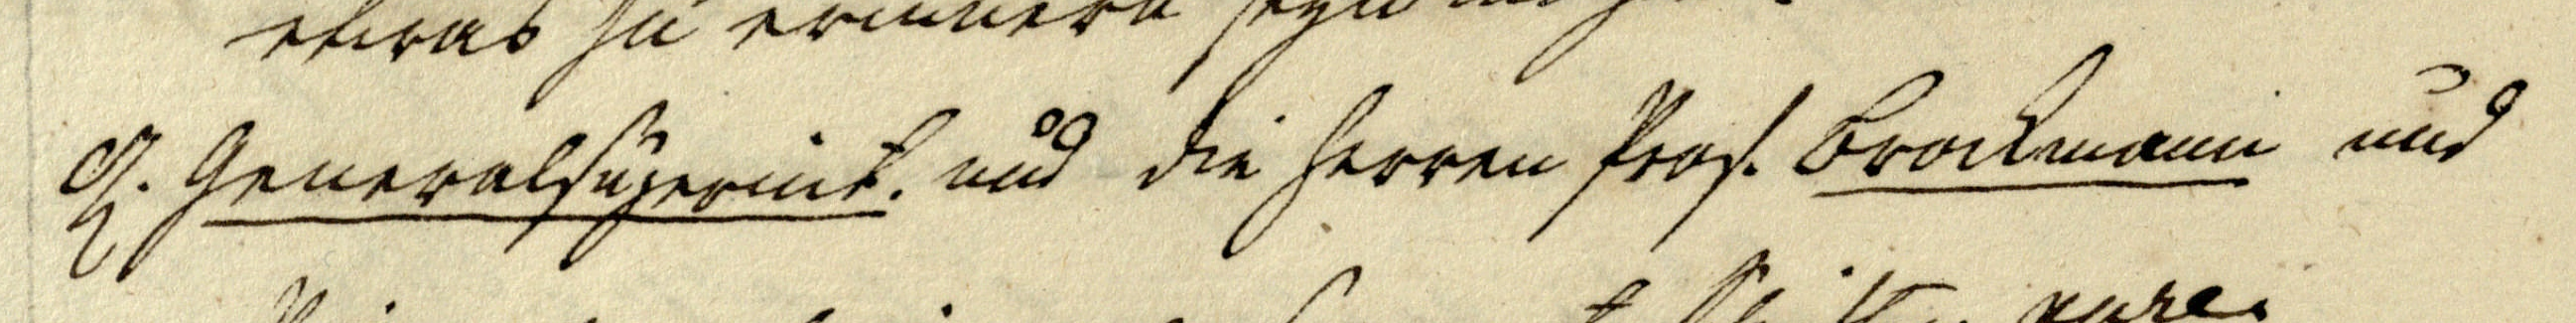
dh. Generalsuperint. und die Herren Prof. Brockmann und
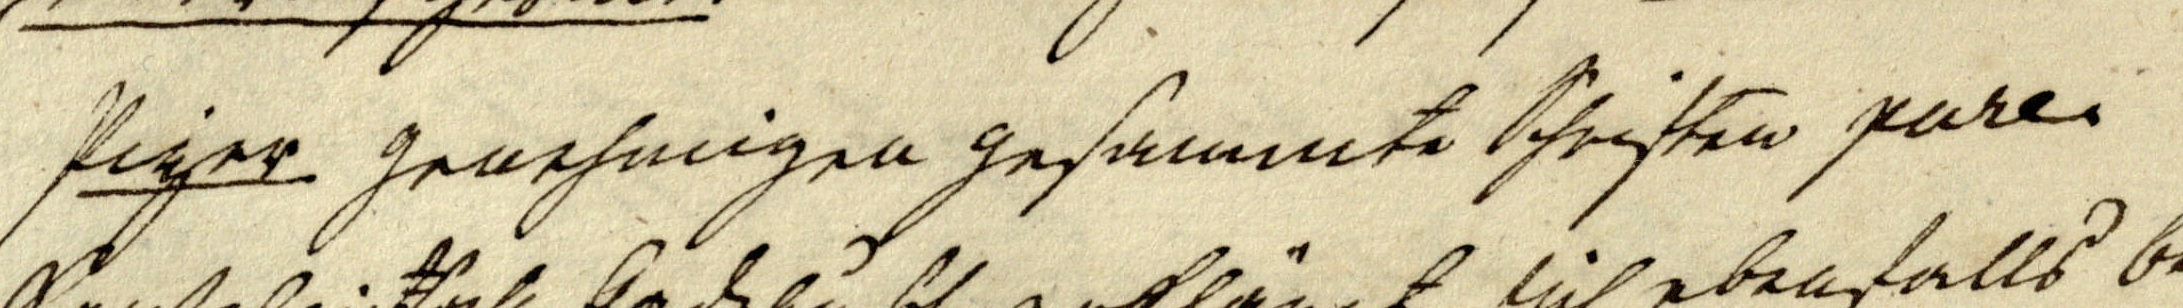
Piper genehmigen gesammte Schriften pure.
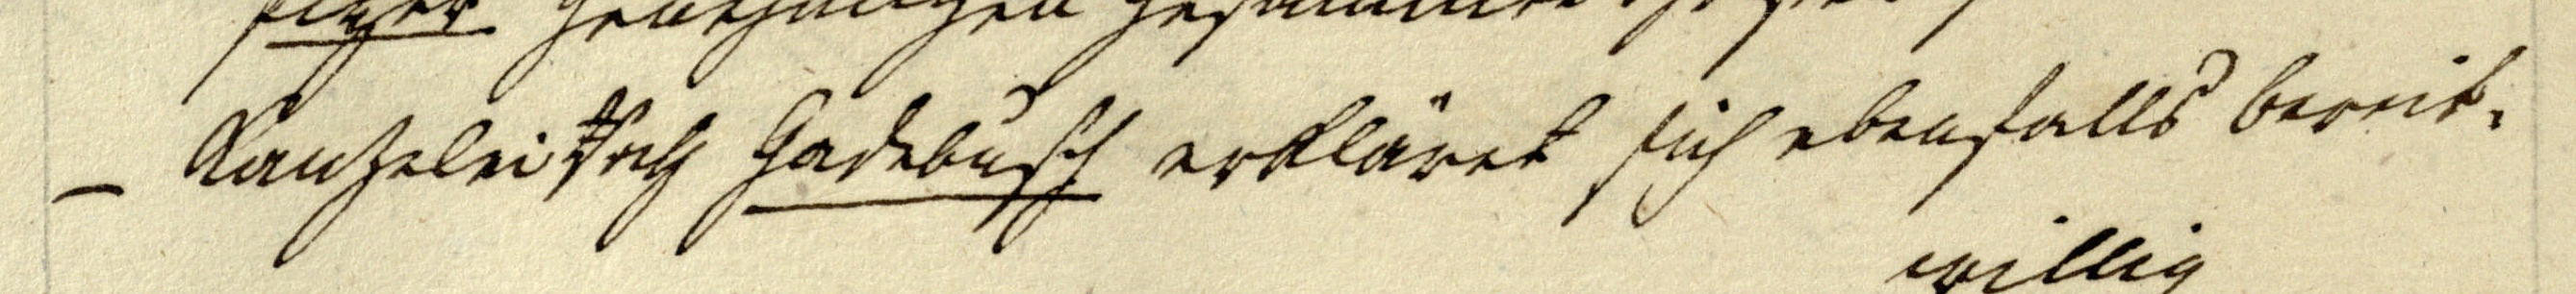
Kanzelei Rath Gadebusch erkläret sich ebenfalls bereit¬
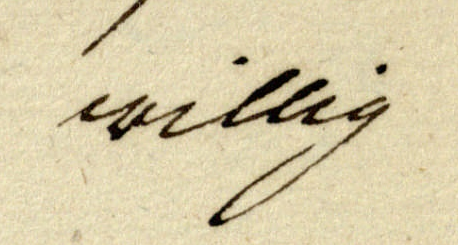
willig
